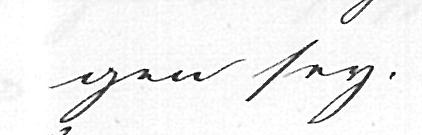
gen sey.
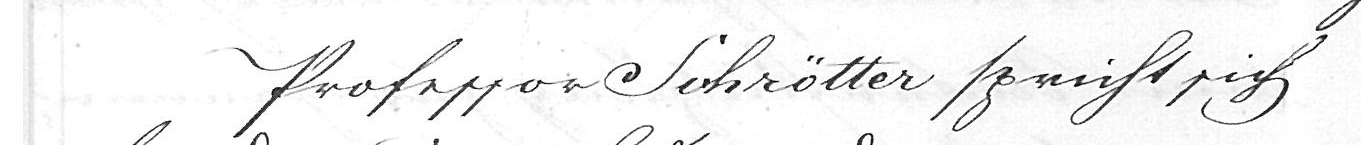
Professo rSchrötter spricht sich
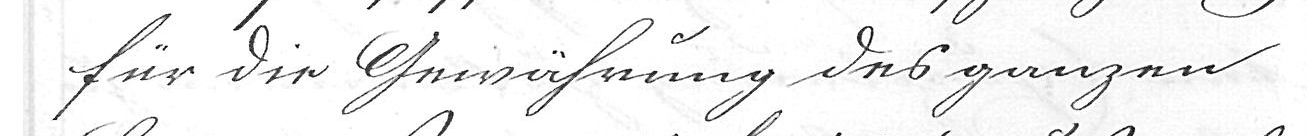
für die Gewähnung des ganzen
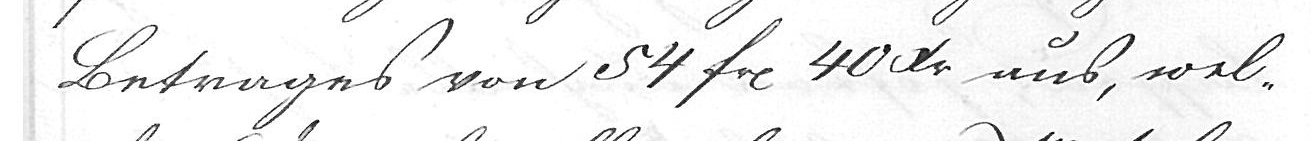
Betrages von 54 fl 40 kr aus, wel-
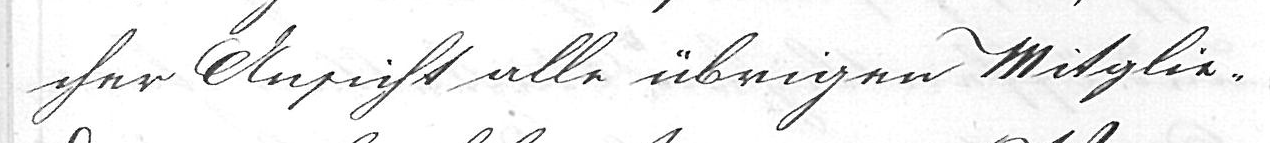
cher Ansicht alle übrigen Mitglie-
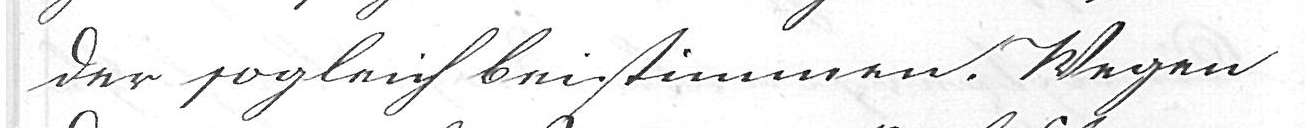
der sogleich beistimmen. Wegen
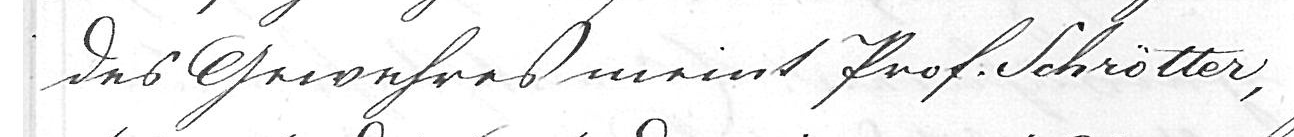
des Gewehres meint Prof. Schrötter,
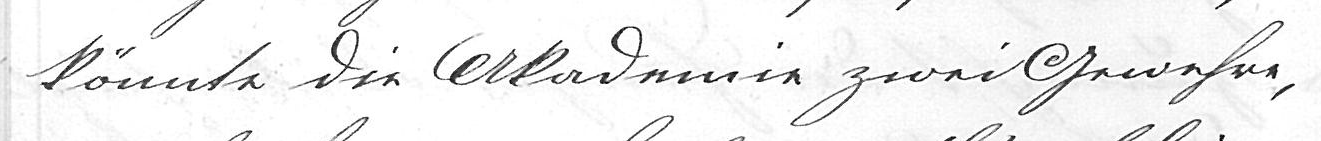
könnte die Akademie zwei Gewehre,
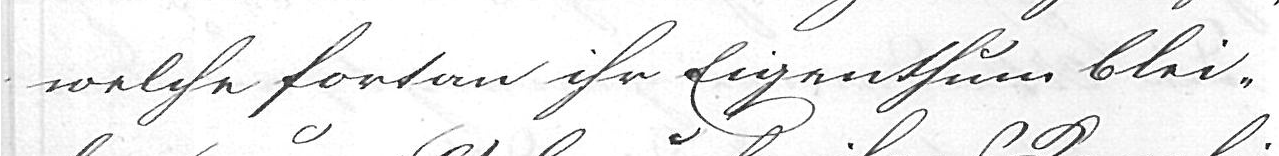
welche fortan ihr Eigenthum blei-
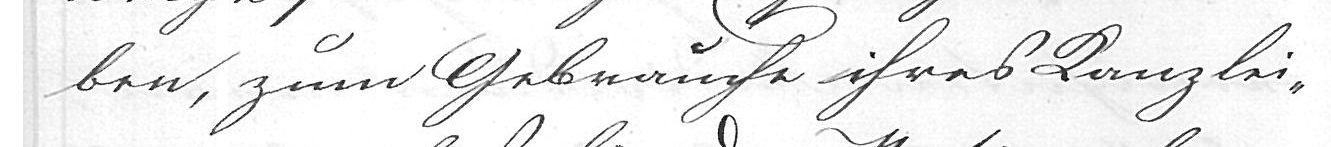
ben, zum Gebrauche ihres Kanzlei-
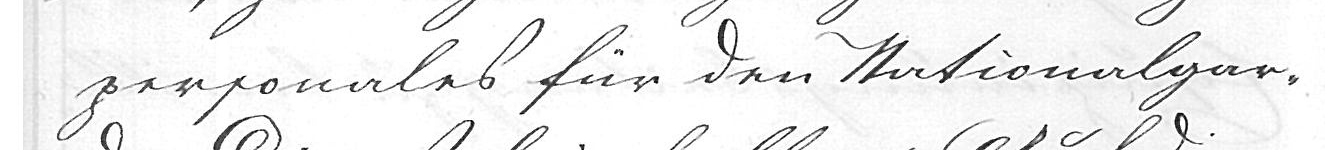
personales für den Nationalgar-
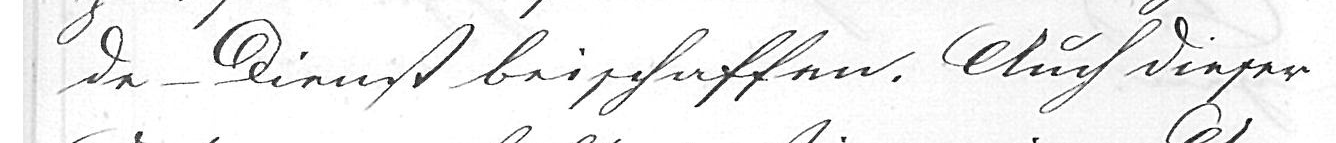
de-Dienst beischaffen. Auch dieser
